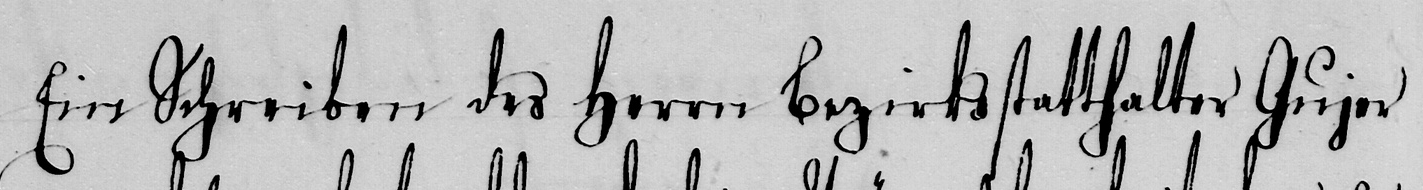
Ein Schreiben des Herrn Bezirksstatthalter Gujer
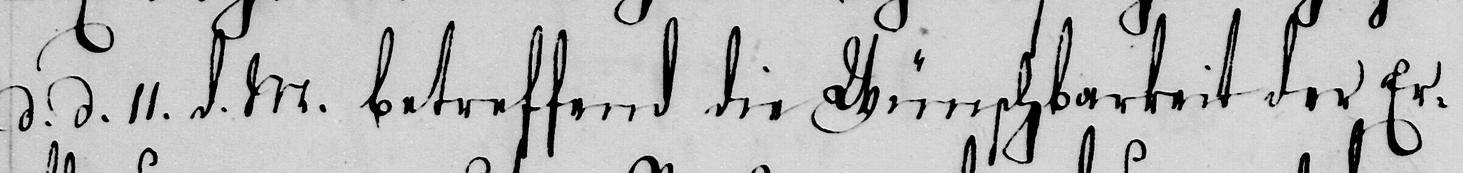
d. 11. d. M. betreffend die Wünschbarkeit der Er¬
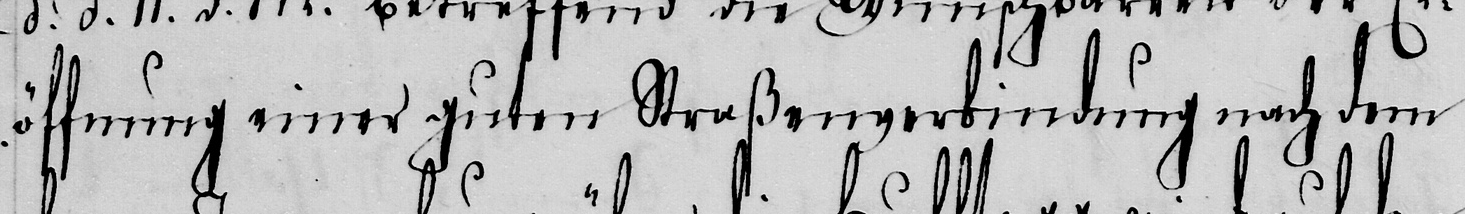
öffnung einer guten Straßenverbindung nach dem
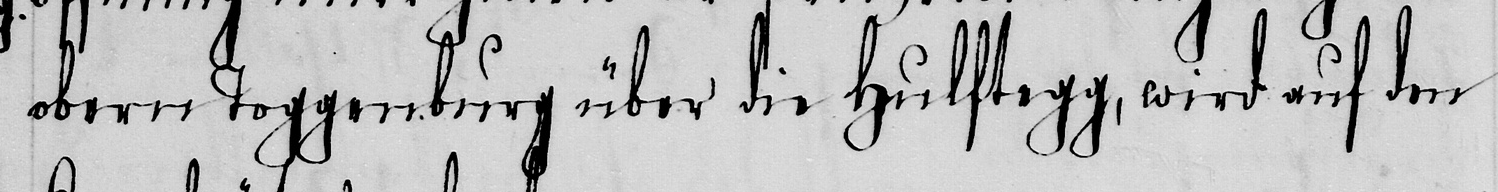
obern Toggenburg über die Hulftegg, wird auf den
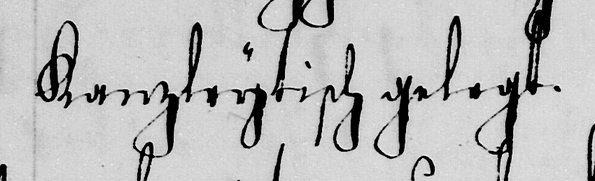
Kanzleytisch gelegt.
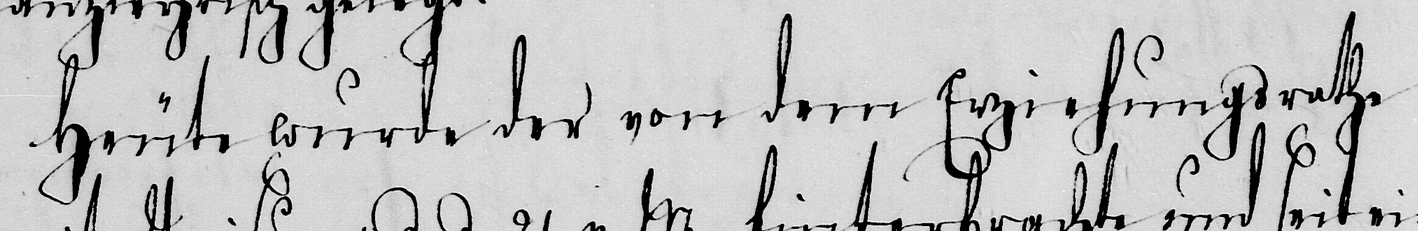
Heute wurde der von dem Erziehungsrathe
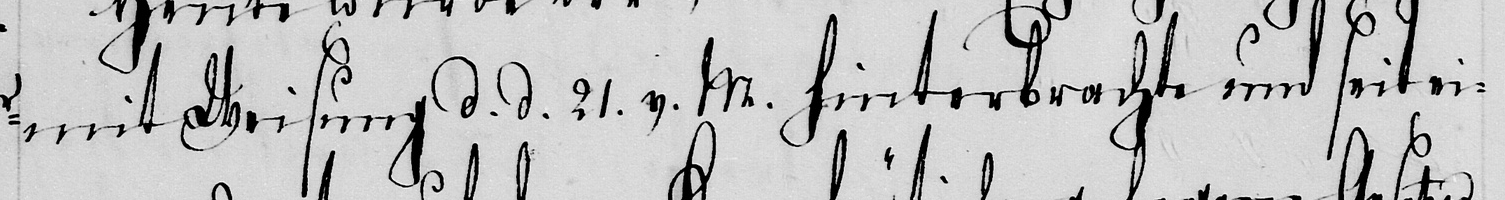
mit Weisung d. d. 21. v. M. hinterbrachte und seit ei¬
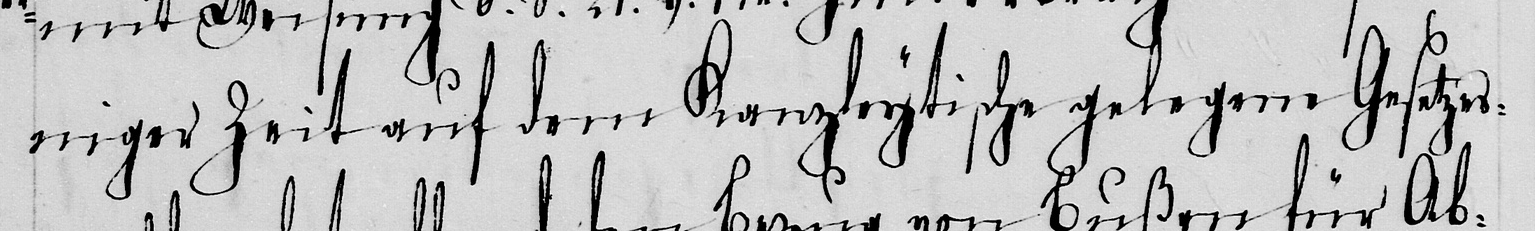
niger Zeit auf dem Kanzleytisch gelegene Gesetze¬
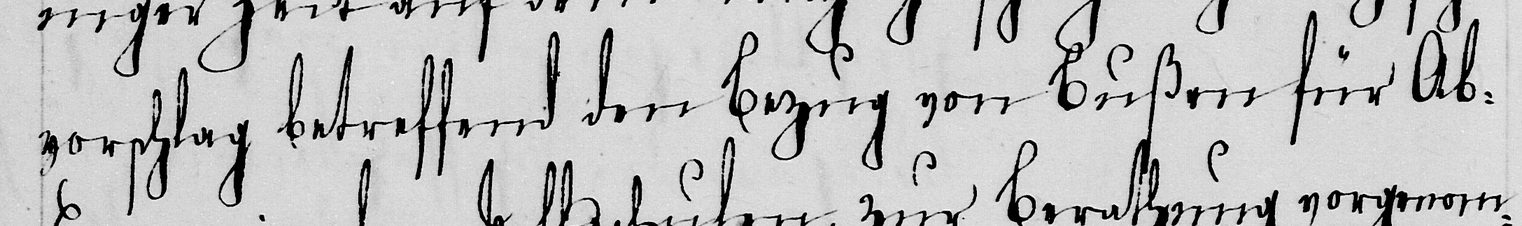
svorschlag betreffend den Bezug von Bußen für Ab¬
